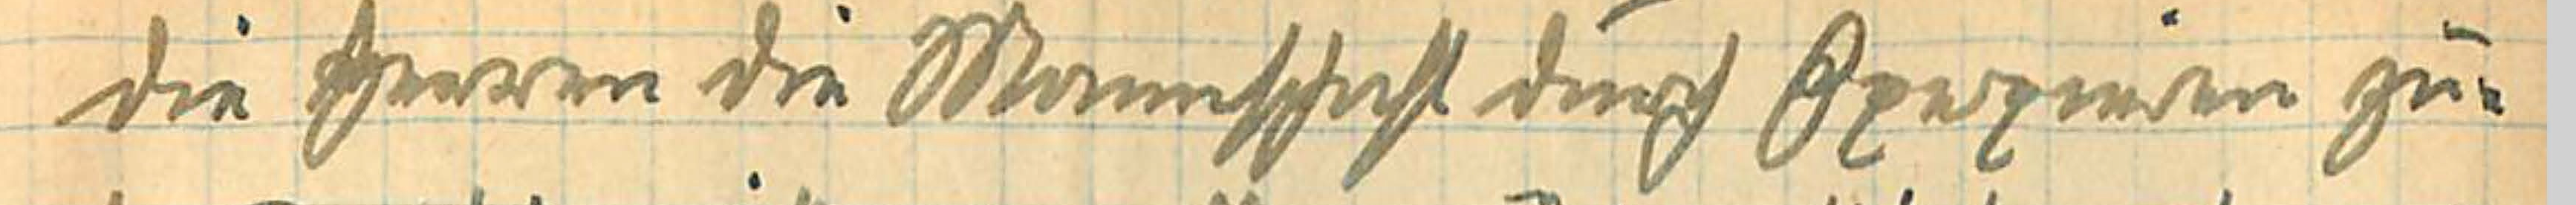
die Herren die Mannschaft durch Exerzieren zu-
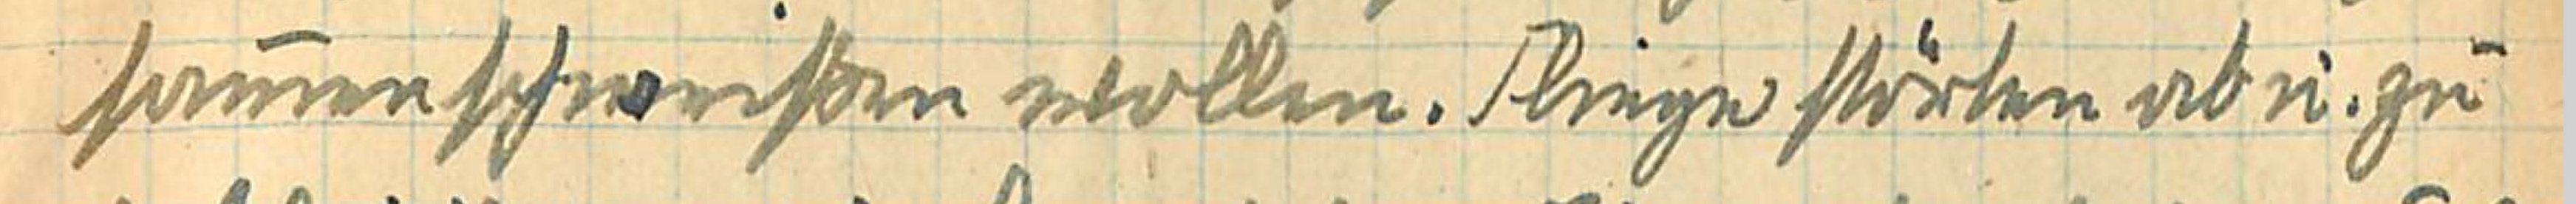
sammenschweißen wollen. Flieger störten ab u. zu
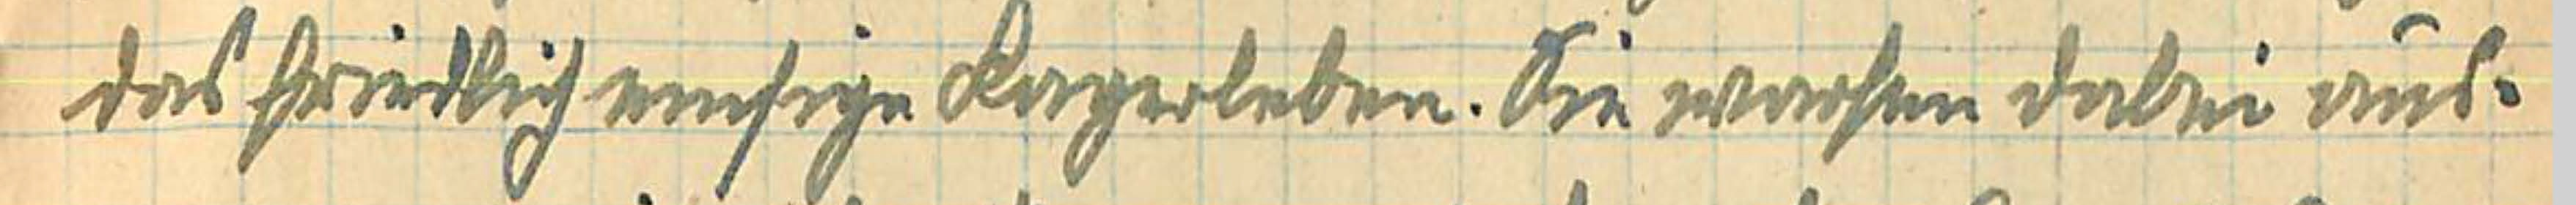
das friedlich emsige Lagerleben. Sie warfen dabei aus-
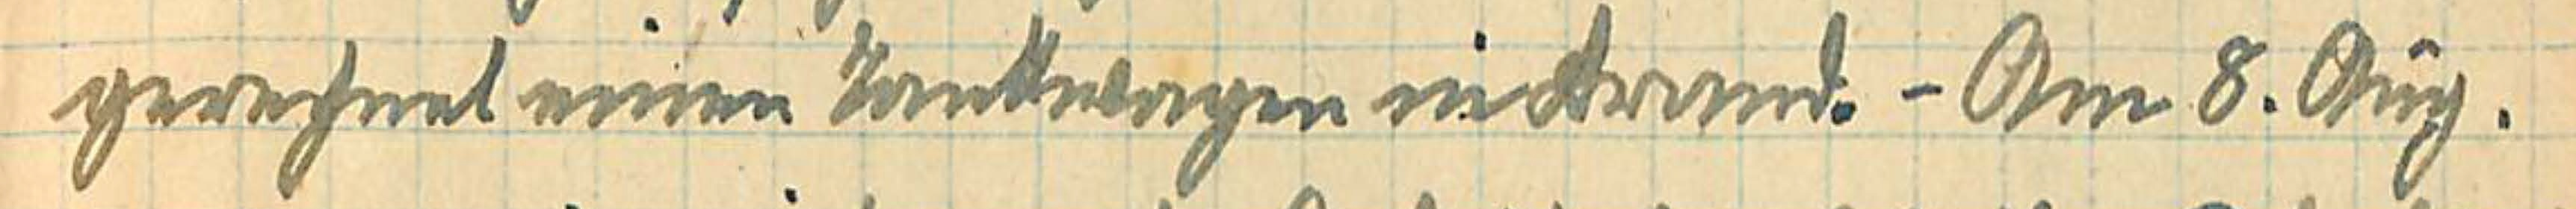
gerechnet einen Tankwagen in Brand. – Am 8. Aug.
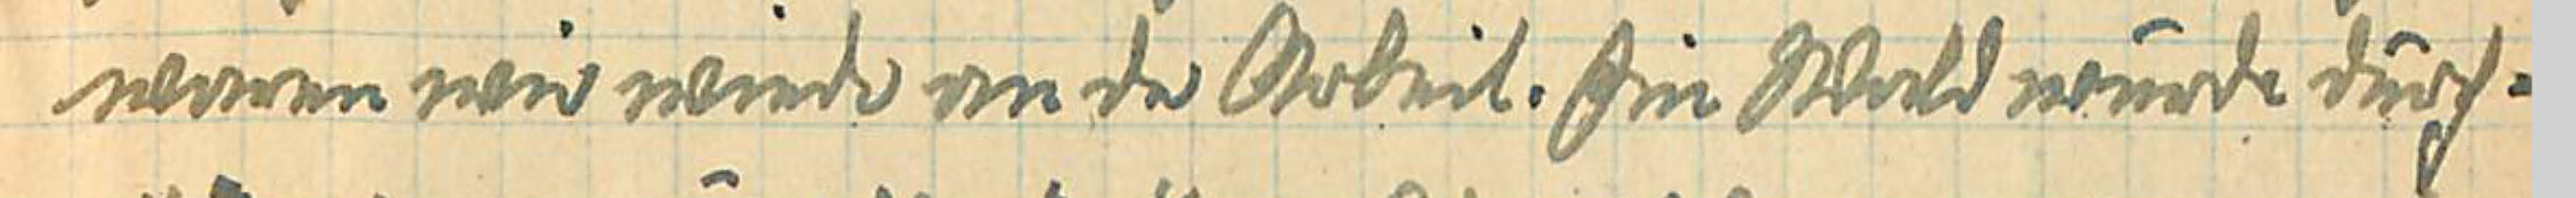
waren wir wieder an der Arbeit. Ein Wald wurde durch-
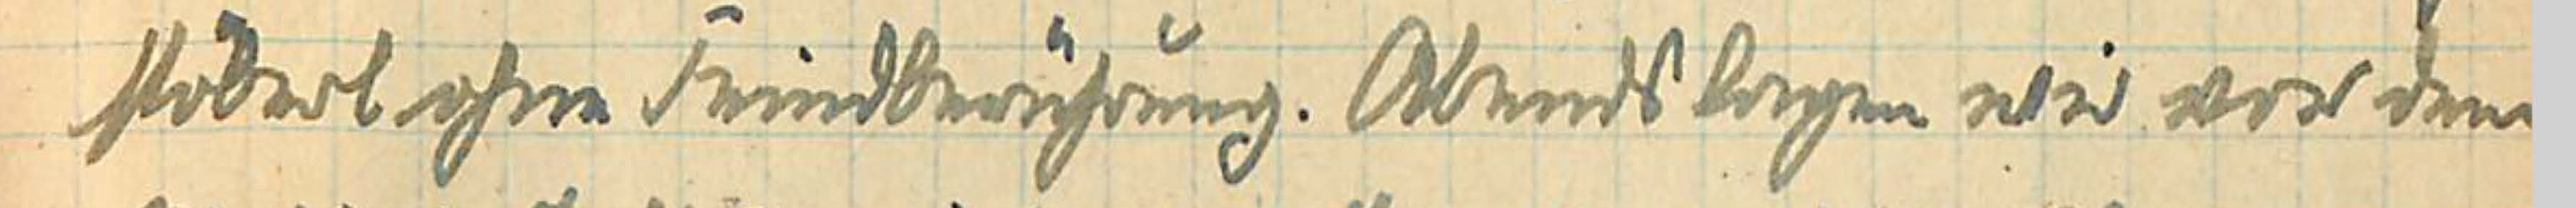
stöbert ohne Feindberührung. Abends lagen wir vor dem
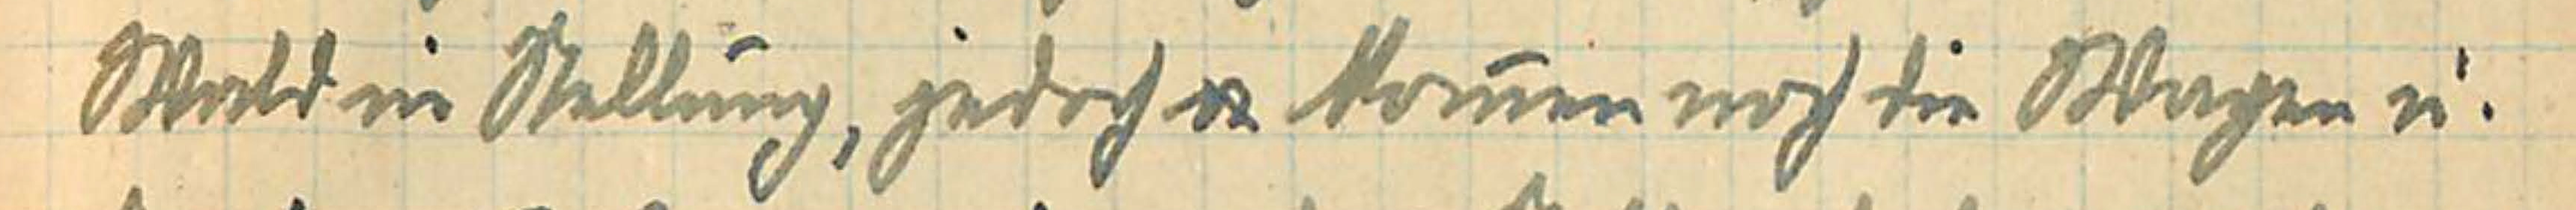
Wald in Stellung, jedoch a kommen noch die Wagen u.
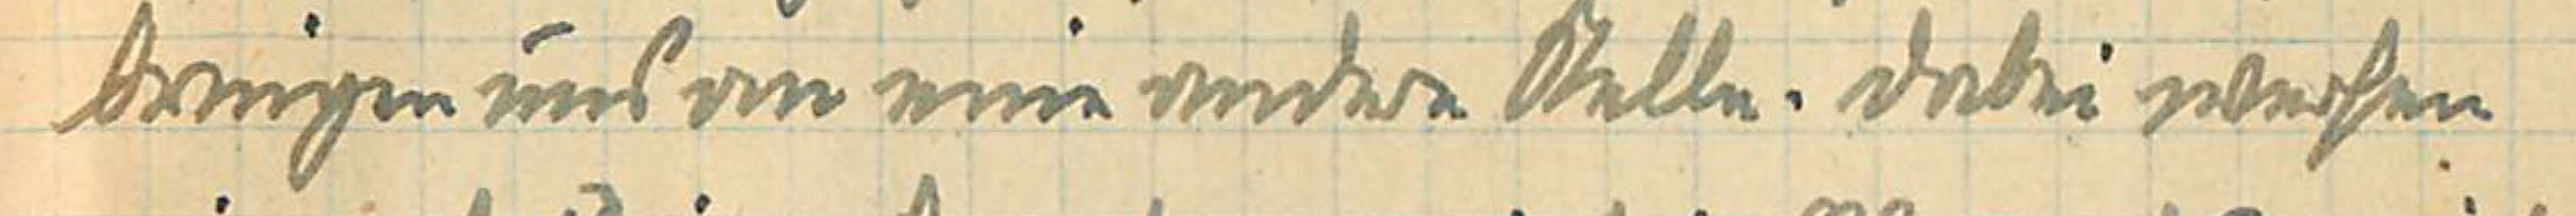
bringen uns an eine andere Stelle. Dabei werfen
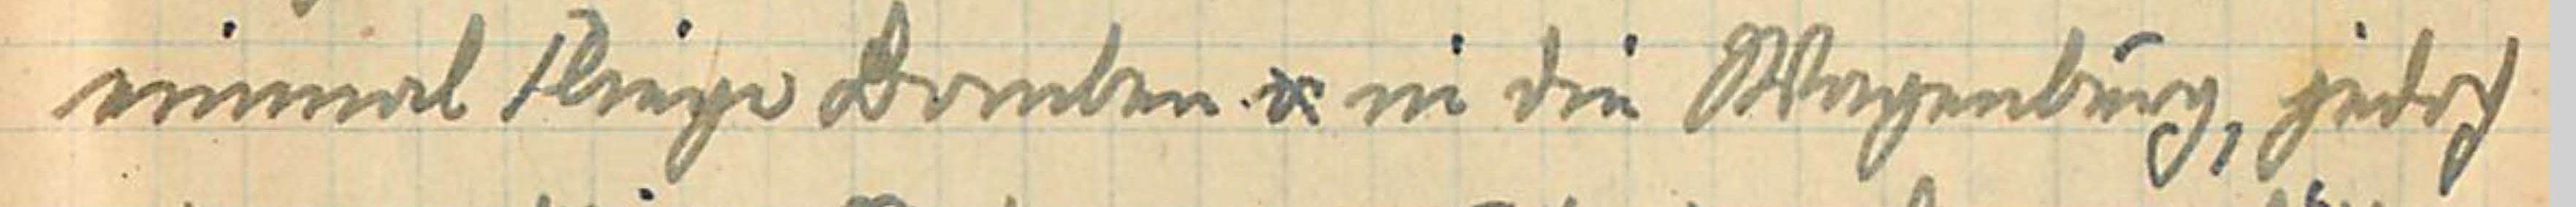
einmal Flieger Bomben a in die Wagenburg, jedoch
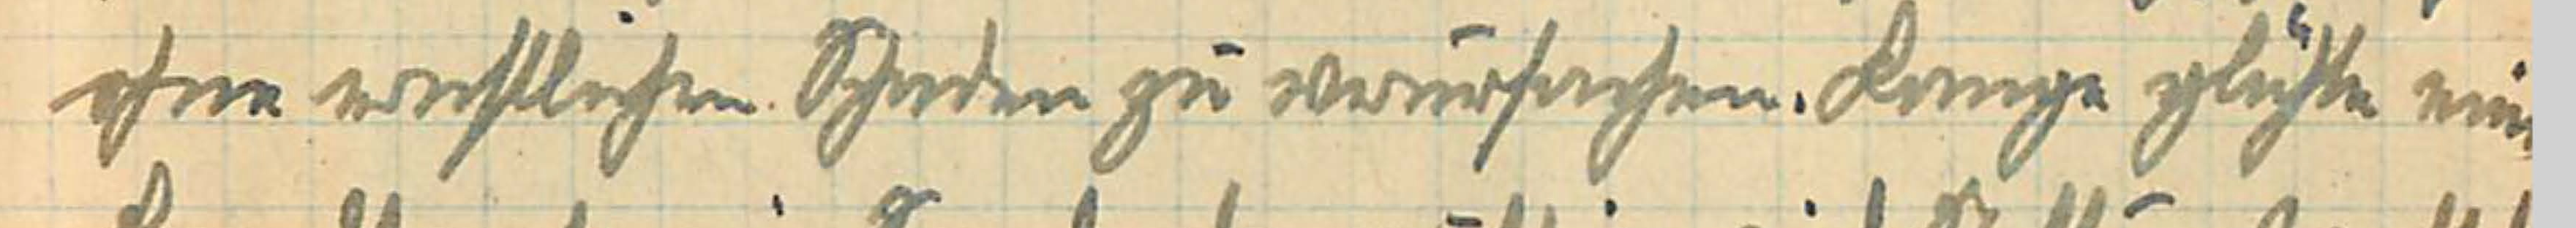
ohne ernstlichen Schaden zu verursachen. Lange glühte eine
